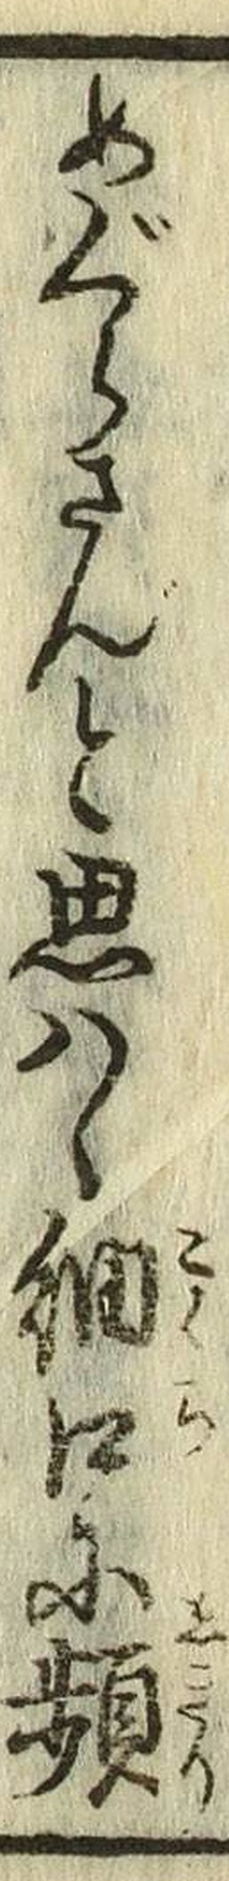めぐらさんと思はゝ細口に頻
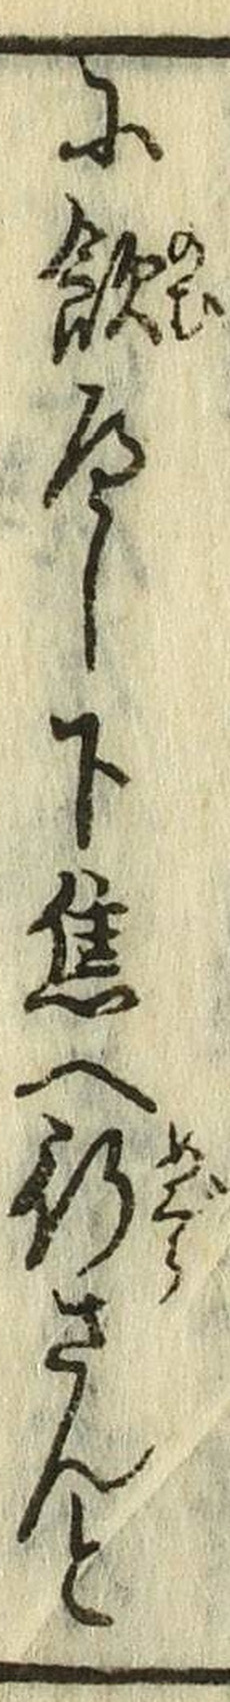に飲へし下焦へ行さんと
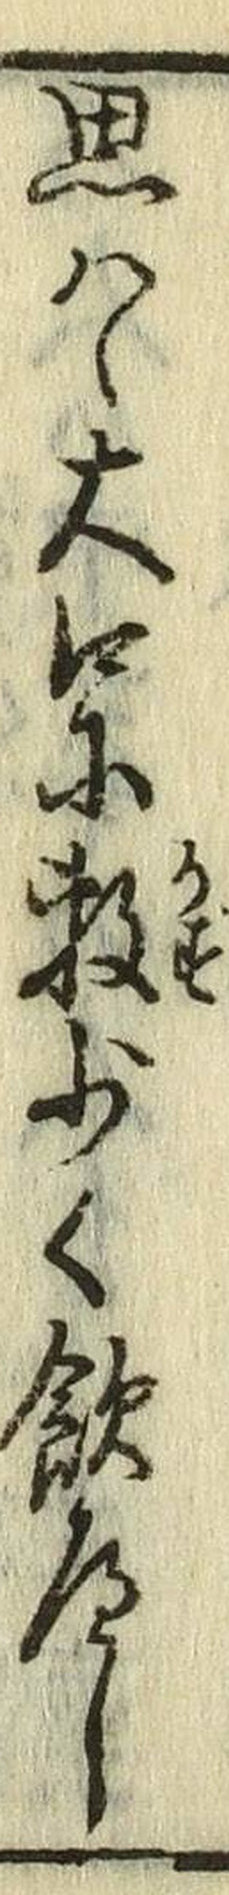思はゝ大口に数少く飲へし
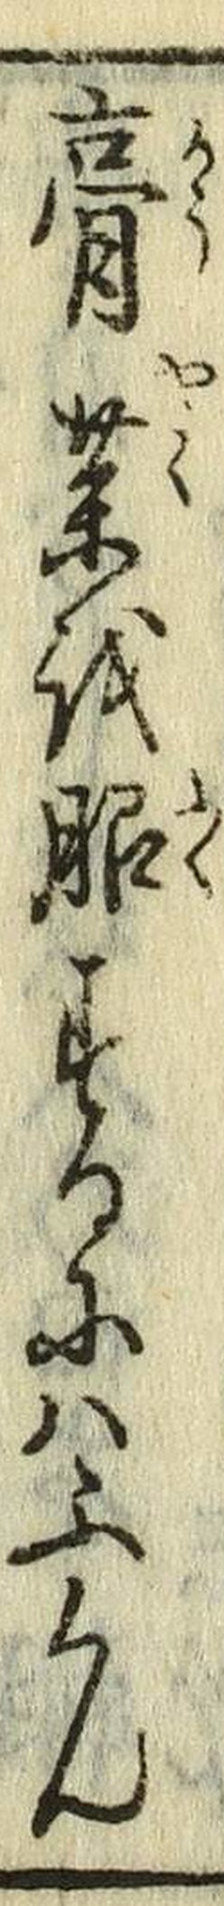膏薬を服するにはふくん
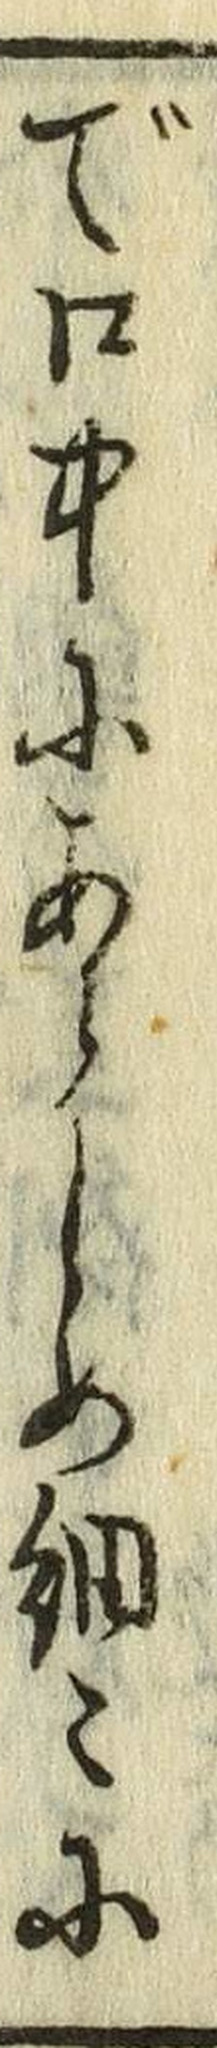で口中にあらしめ細々に
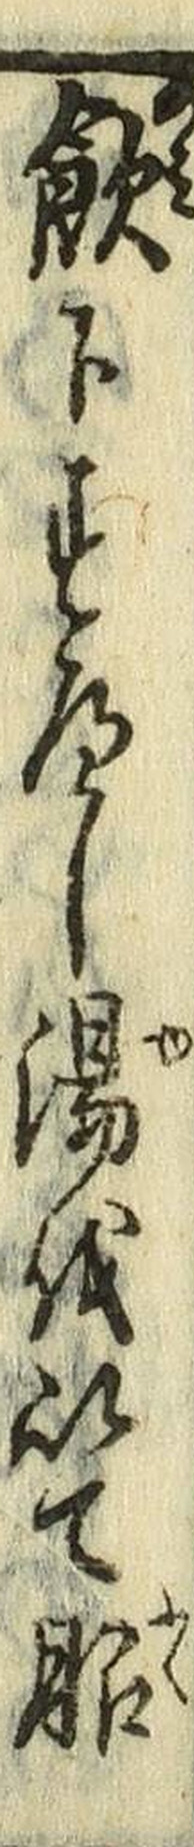飲下すへし湯を以て服
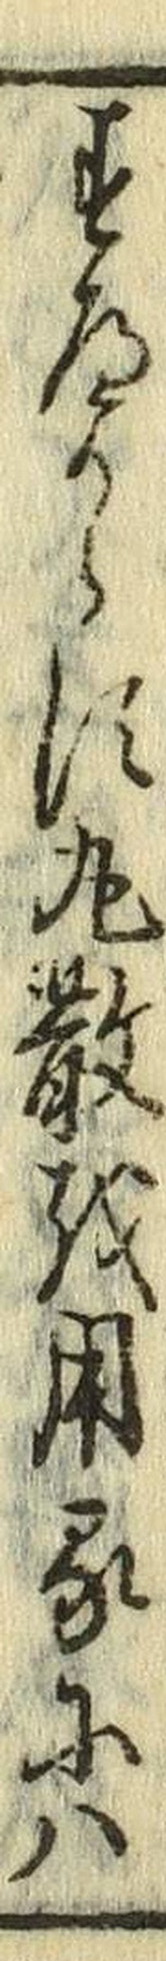すへからす丸散を用るには
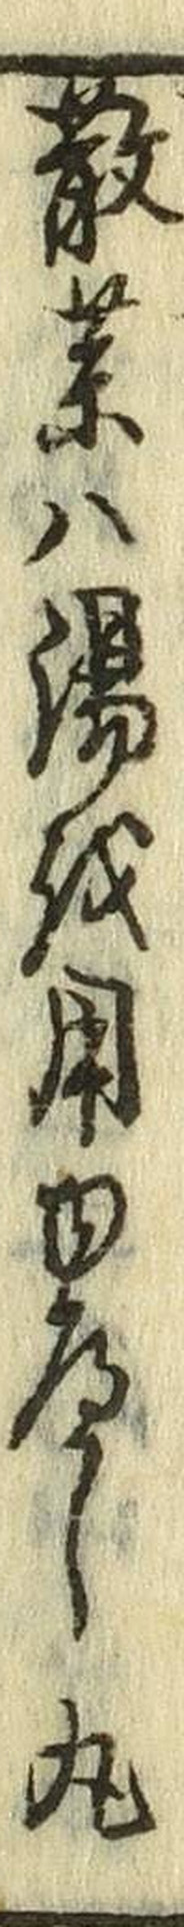散薬は湯を用ゆへし丸
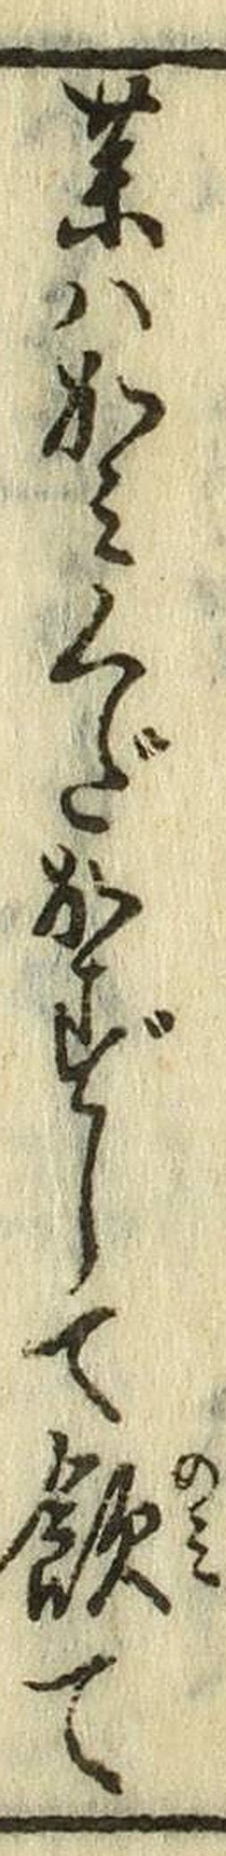薬はかみくだかずして飲て
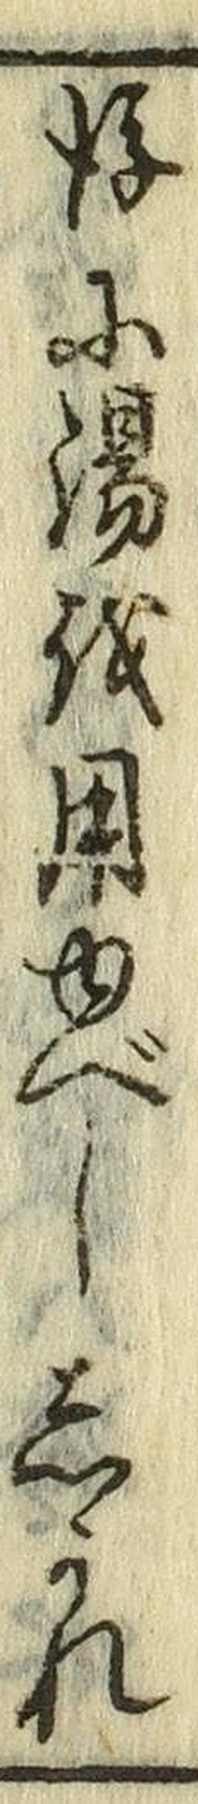後に湯を用ゆべししかれ
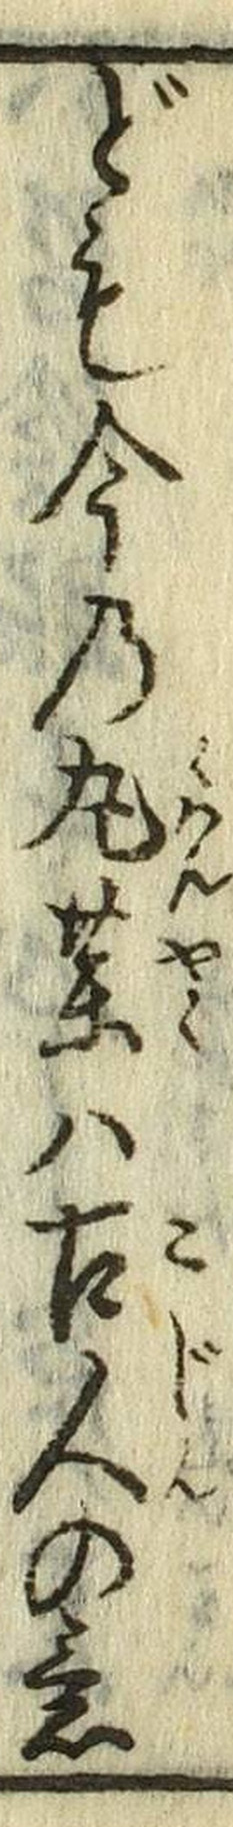ども今の丸薬は古人の意
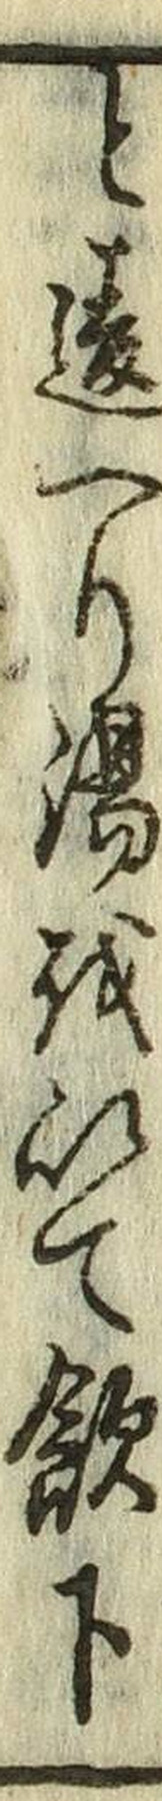と違へり湯を以て飲下
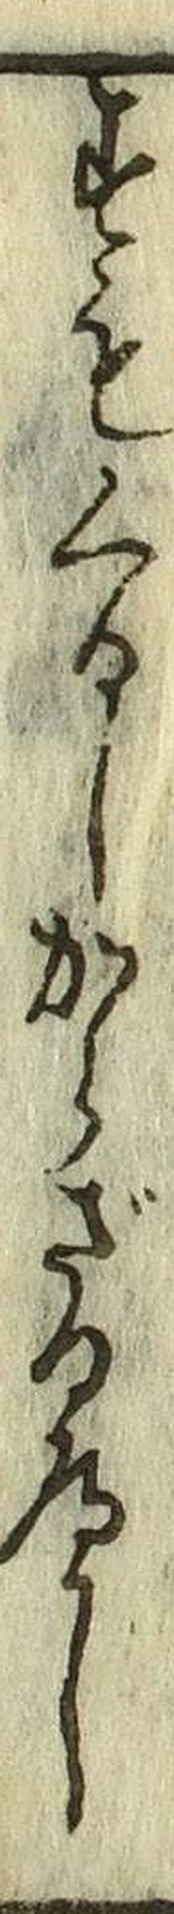すもくるしからざるへし
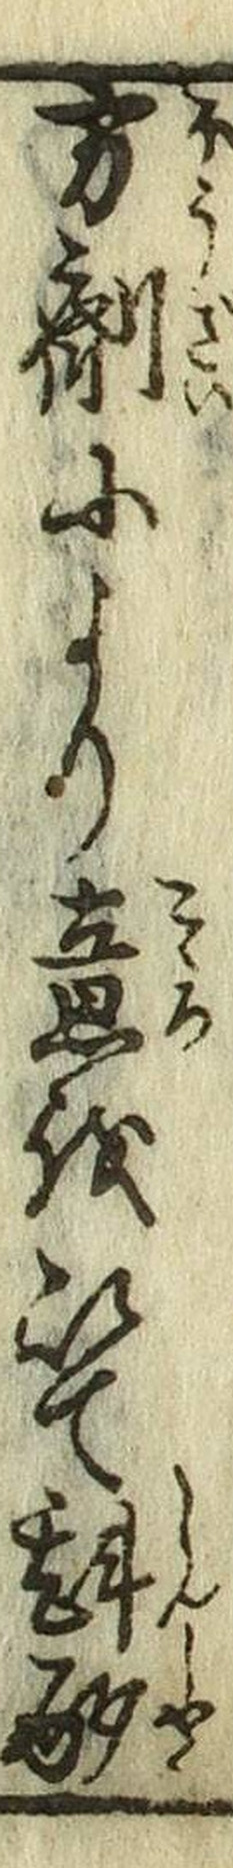方剤により意を以て斟酌
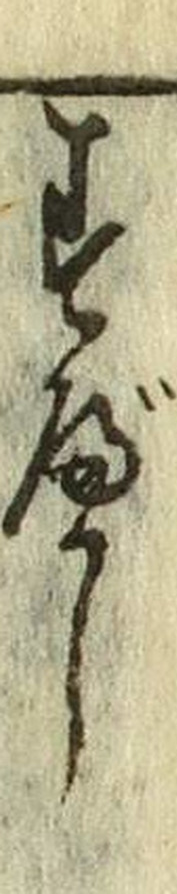すべし
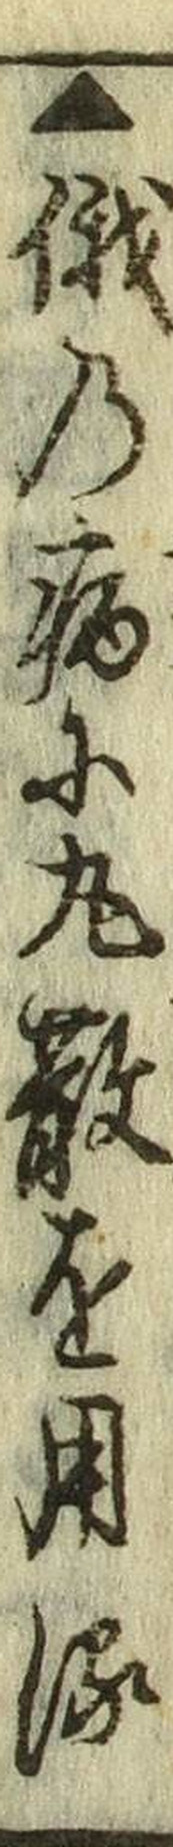▲俄の病に丸散を用る
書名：居家養生記
